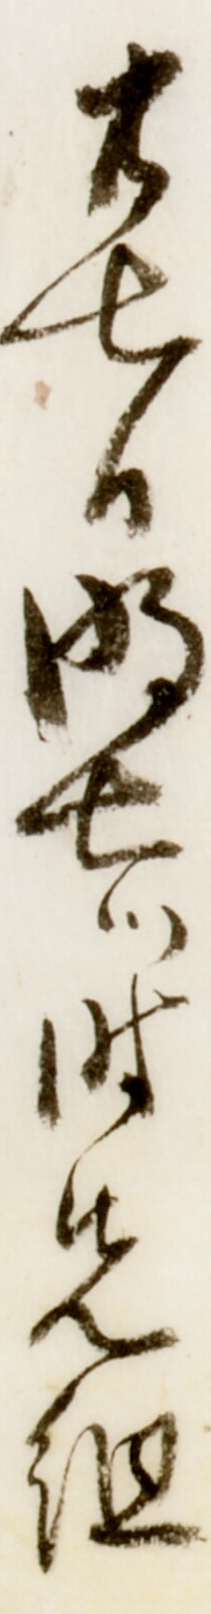廿七日明七ツ時、先組
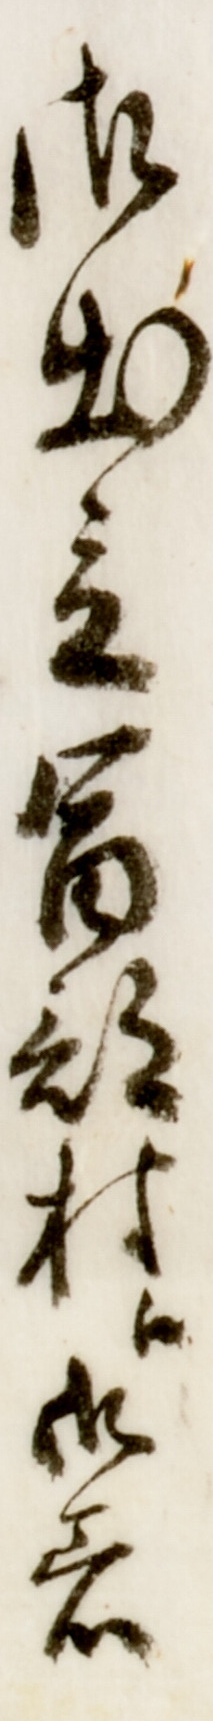御出立、冨部村江御着
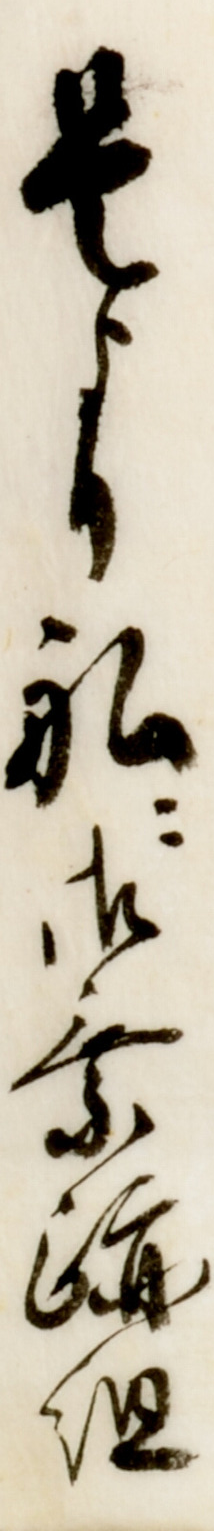是より舩ニ御乗、跡組
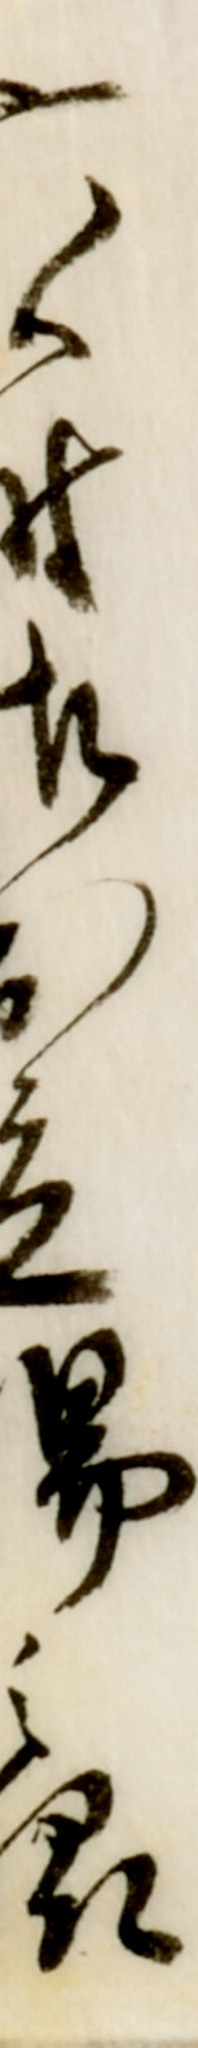六ツ時御出立湯之脇

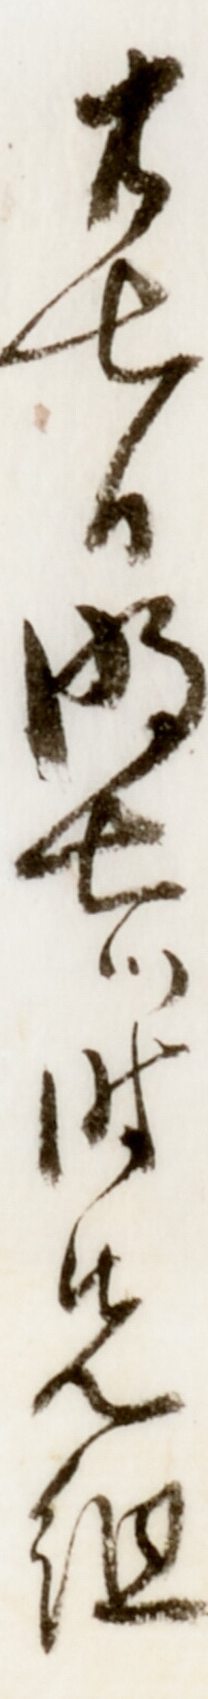廿七日明七ツ時、先組
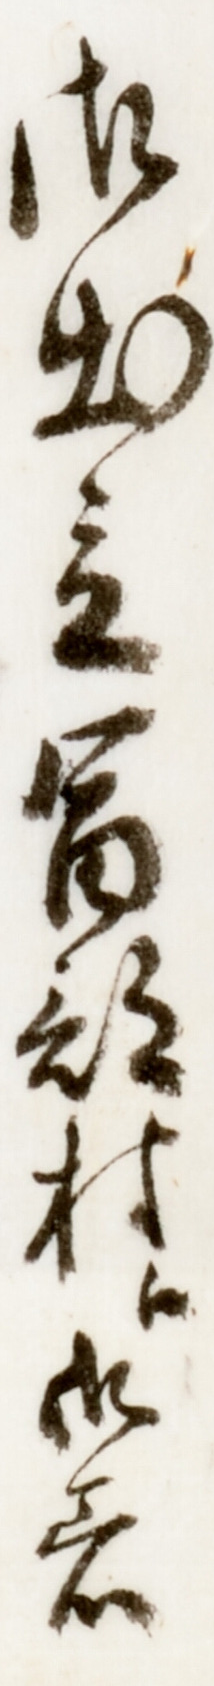御出立、冨部村江御着
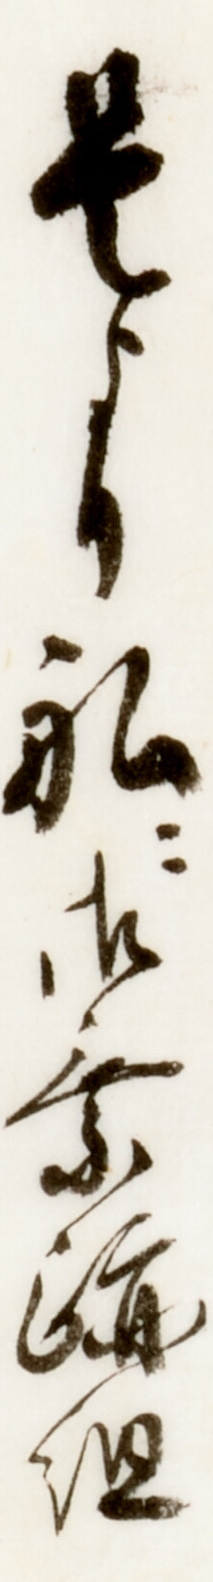是より舩ニ御乗跡組
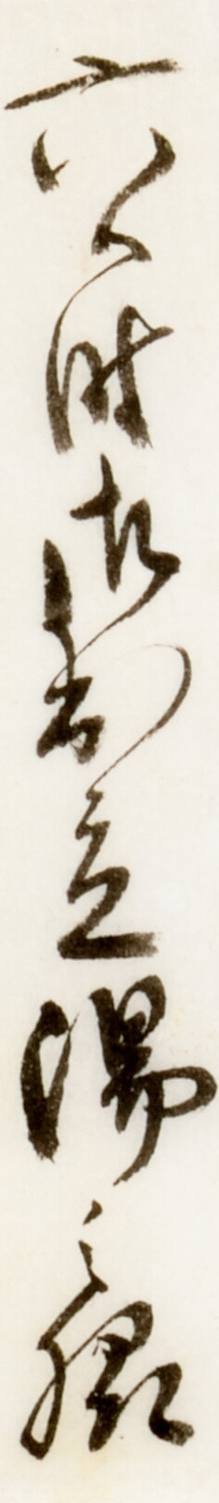六ツ時御出立湯之脇
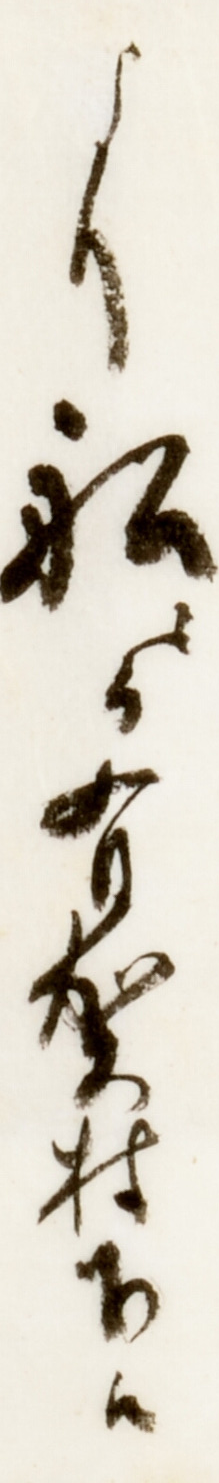より舩ニ手有賀村下江
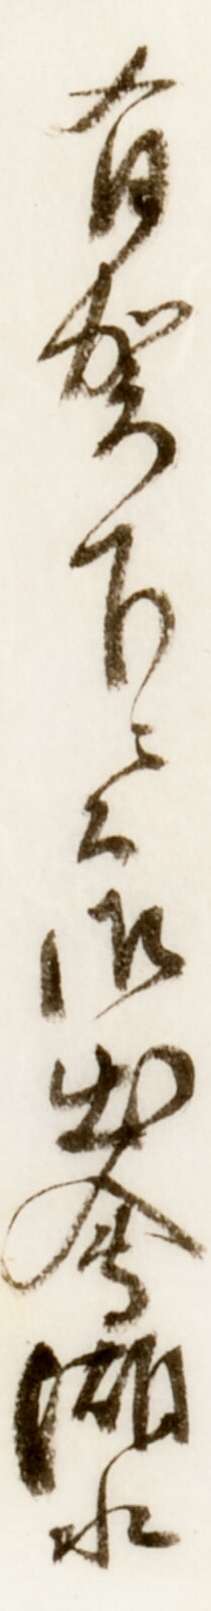有賀下ニ而御出会瀬水
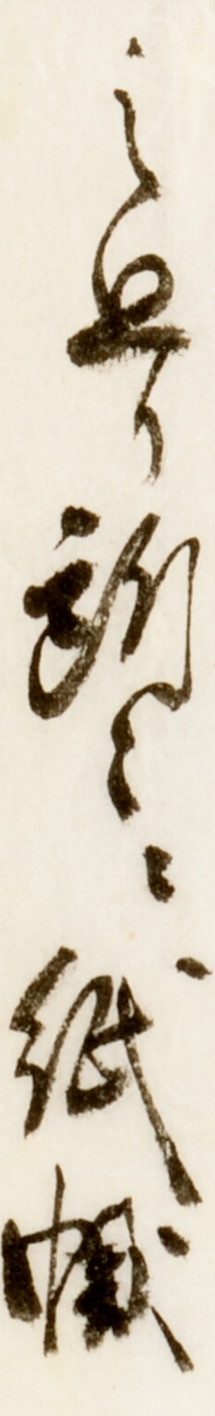之廻り所々ニ紙幟
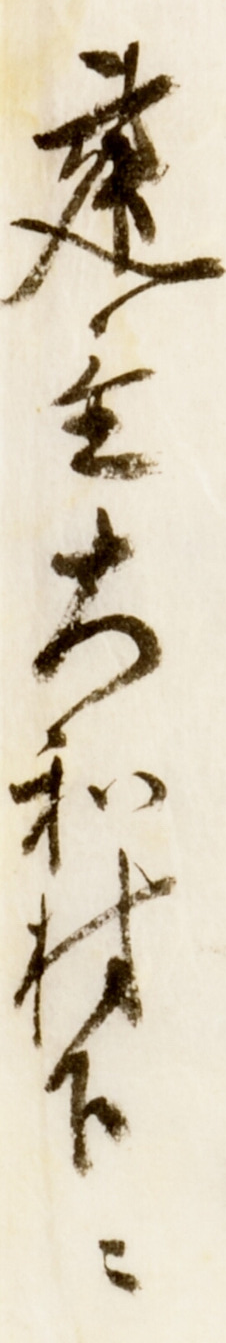建置大和村下ニ
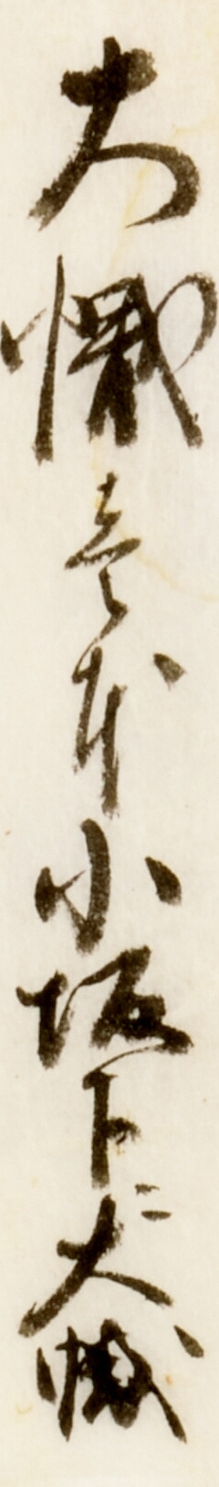大幟壱本小坂下ニ大幟
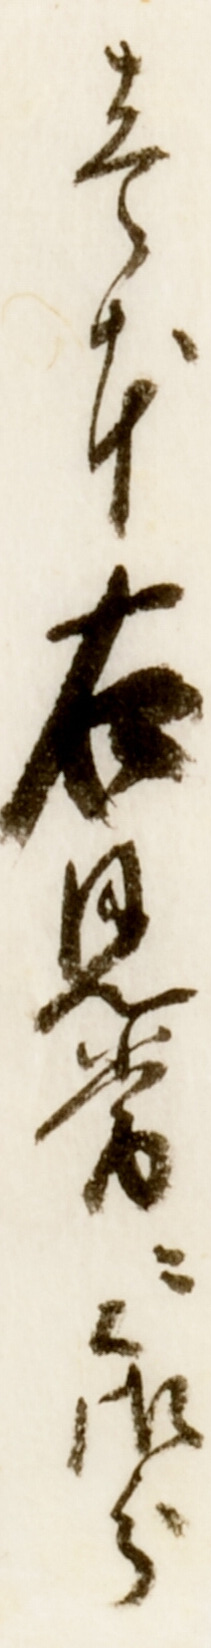壱本右見当ニ而御分
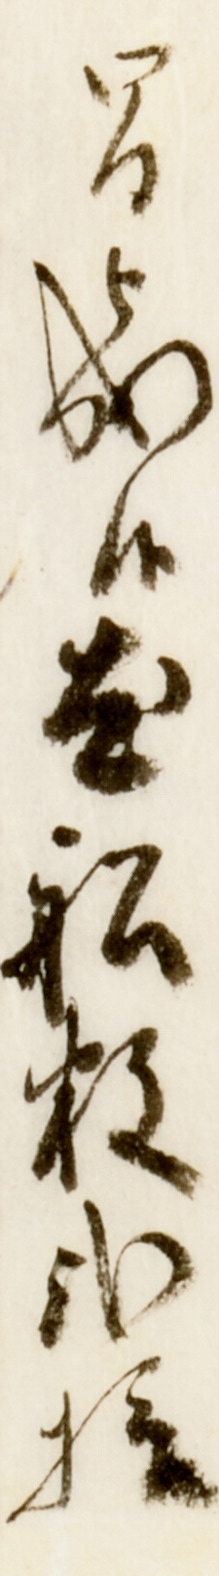間被成候尤舩数弐拾
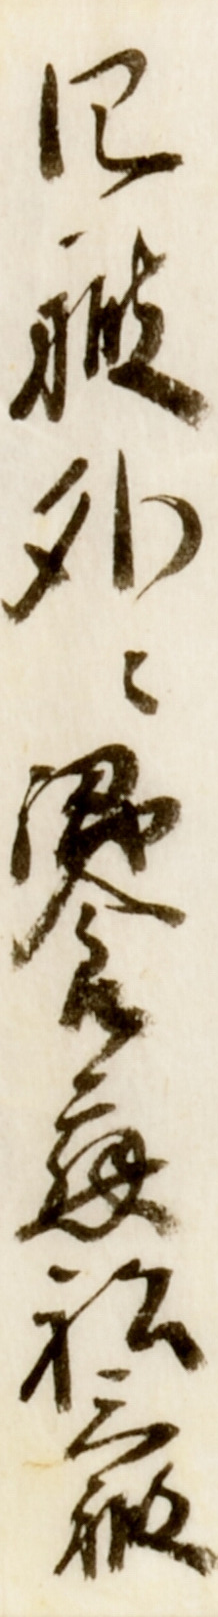四艘外ニ饗応舩三艘
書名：覚
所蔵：伊那市立高遠町図書館・合同会社AMANE
